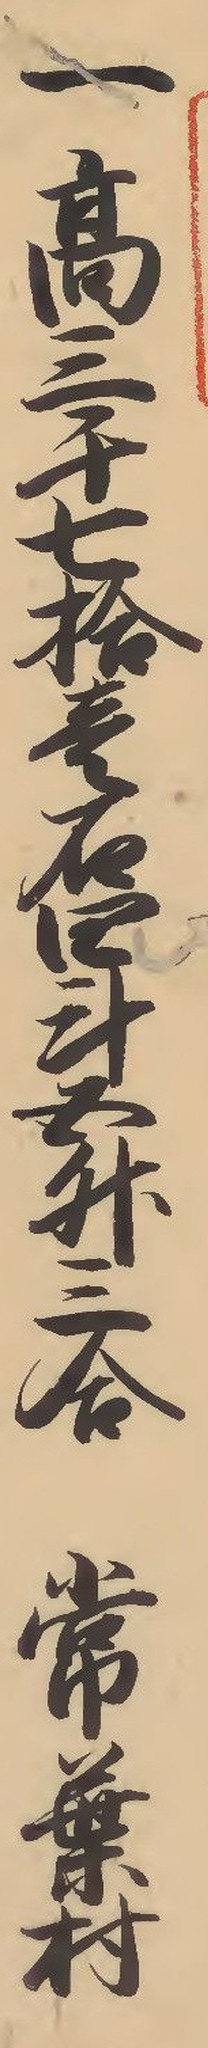一高三千七拾壱石四斗五升三合常葉村
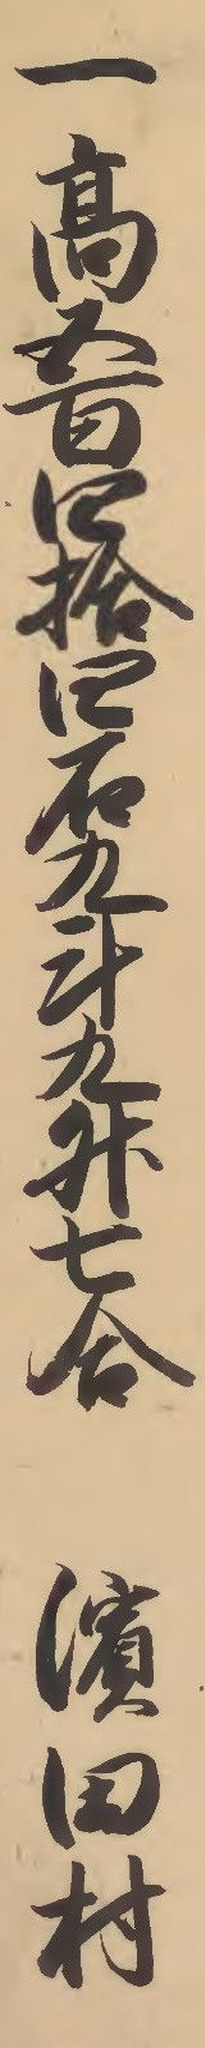一高五百四拾四石九斗九升七合浜田村

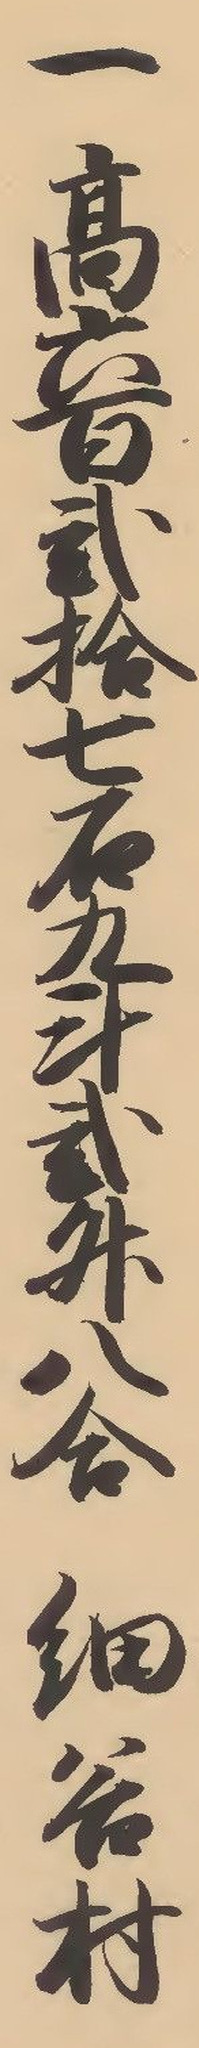一高六百弐拾七石九斗弐升八合細谷村
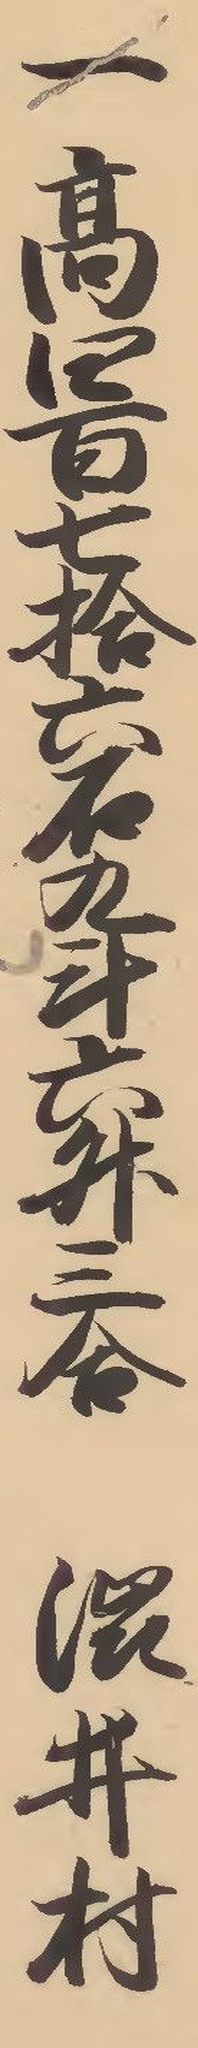一高四百七拾六石九斗六升三合渋井村
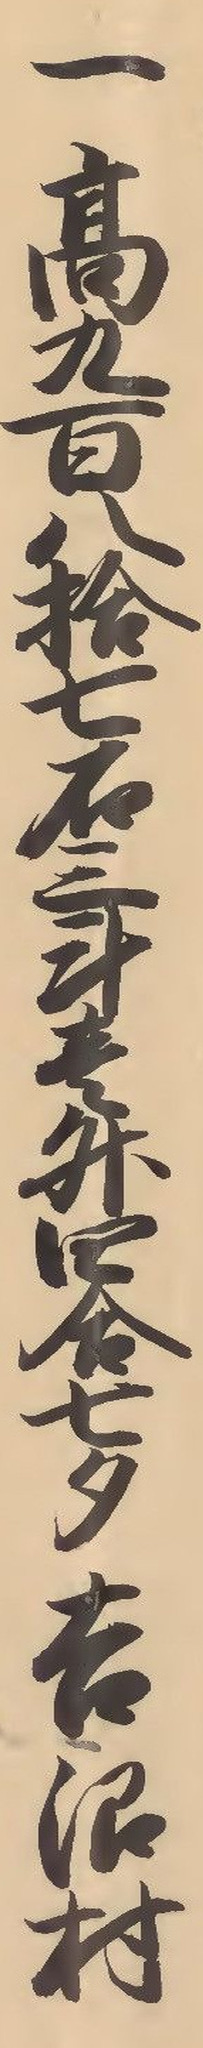一高九百八拾七石三斗壱升四合七勺吉沼村
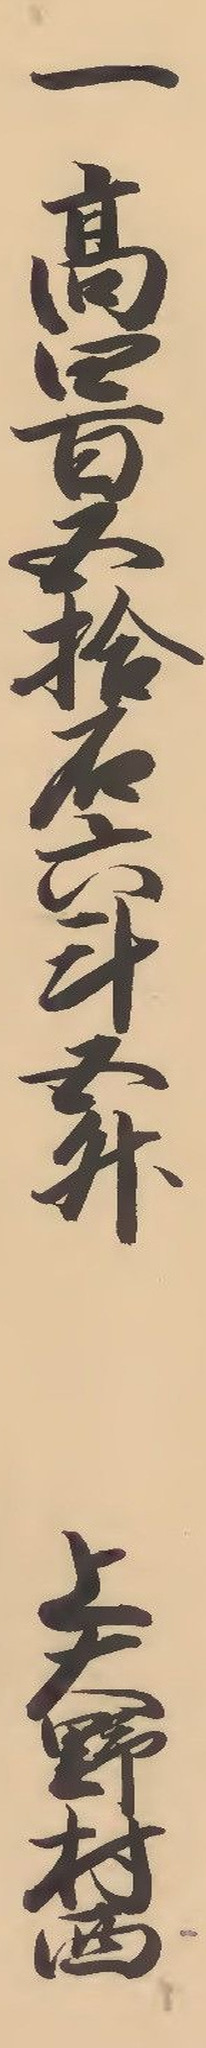一高四百五拾石六斗五升上大野村西
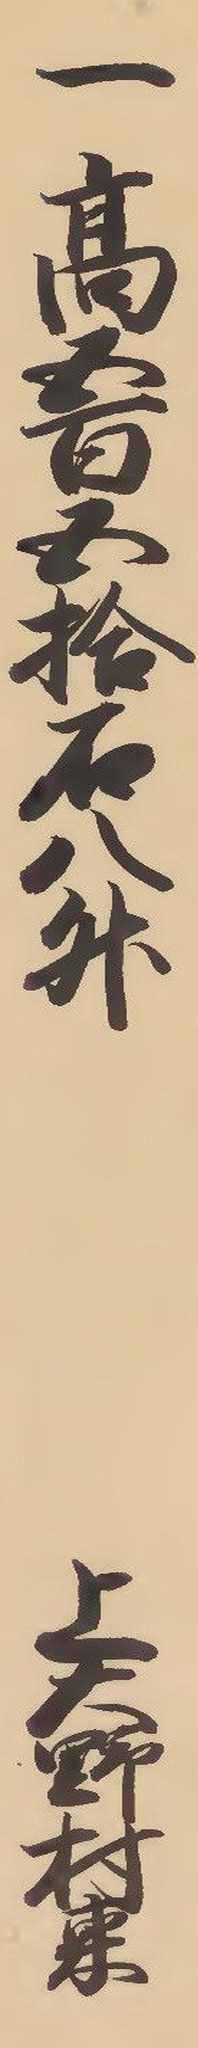一高五百五拾石八升上大野村東
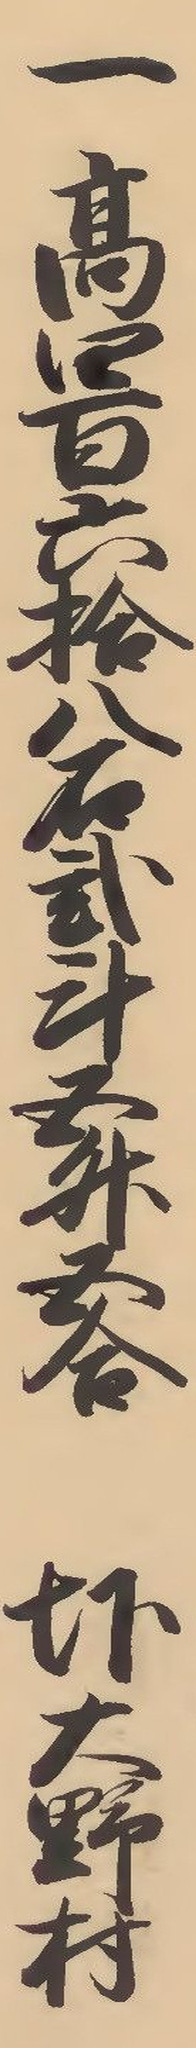一高四百六拾八石弐斗五升五合圷大野村
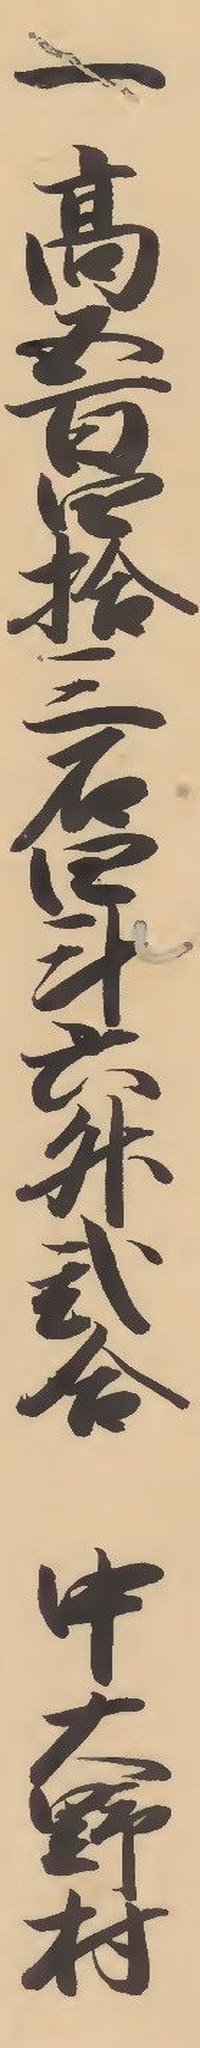一高五百四拾三石四斗六升弐合中大野村
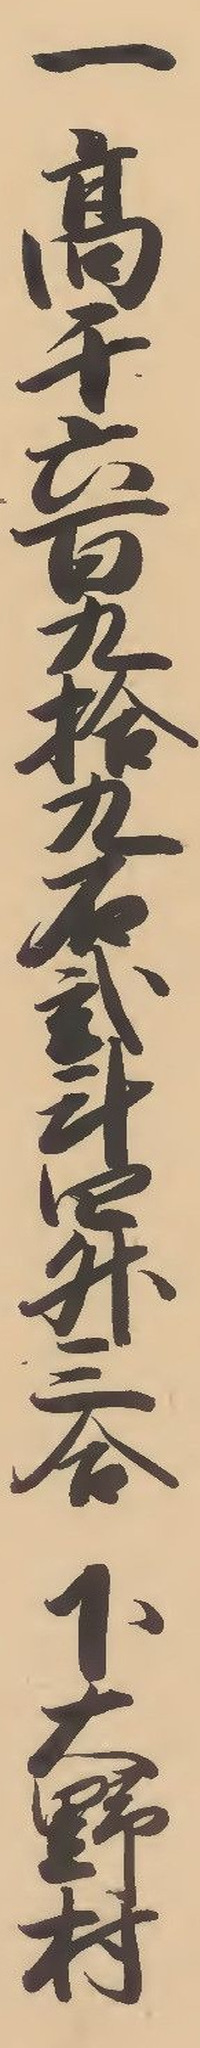一高千六百九拾九石弐斗四升三合下大野村

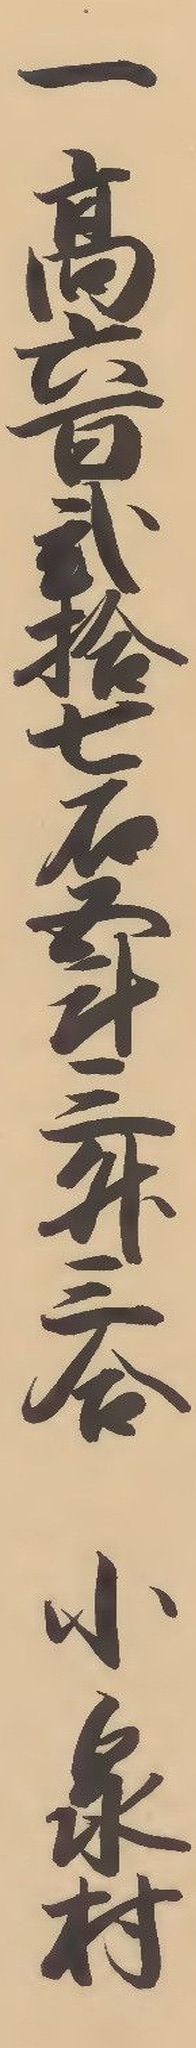一高六百弐拾七石五斗三升三合小泉村
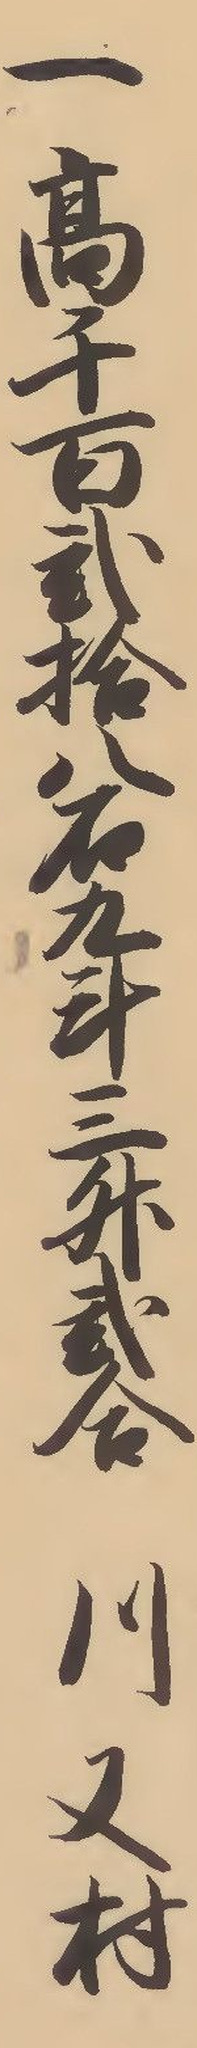一高千百弍拾八石九斗三升弍合川又村
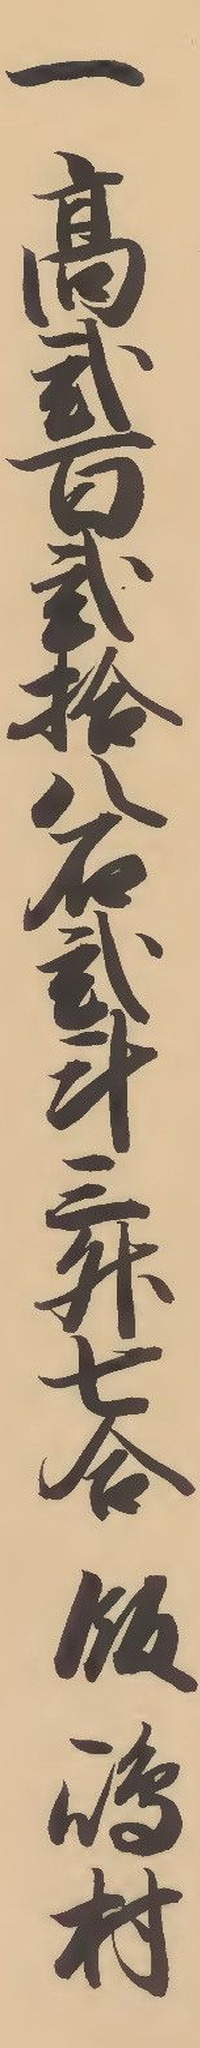一高弍百弍拾八石弍斗三升七合飯嶋村
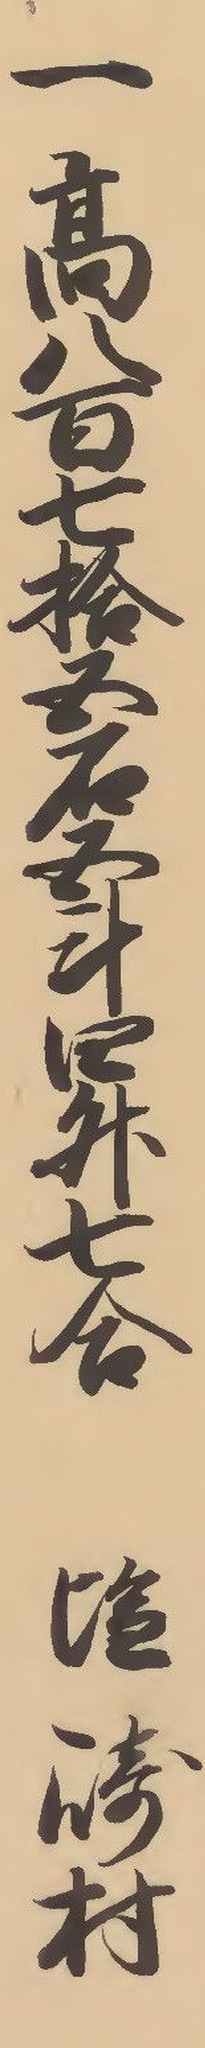一高八百七拾五石五斗四升七合塩崎村
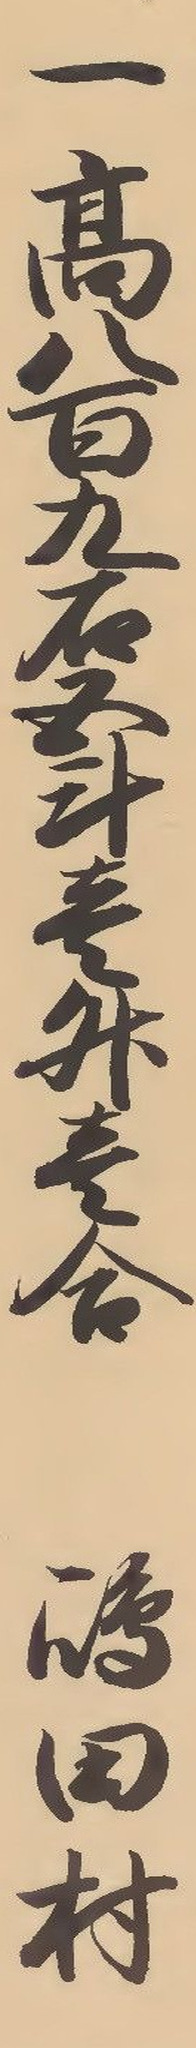一高八百九石五斗壱升壱合嶋田村
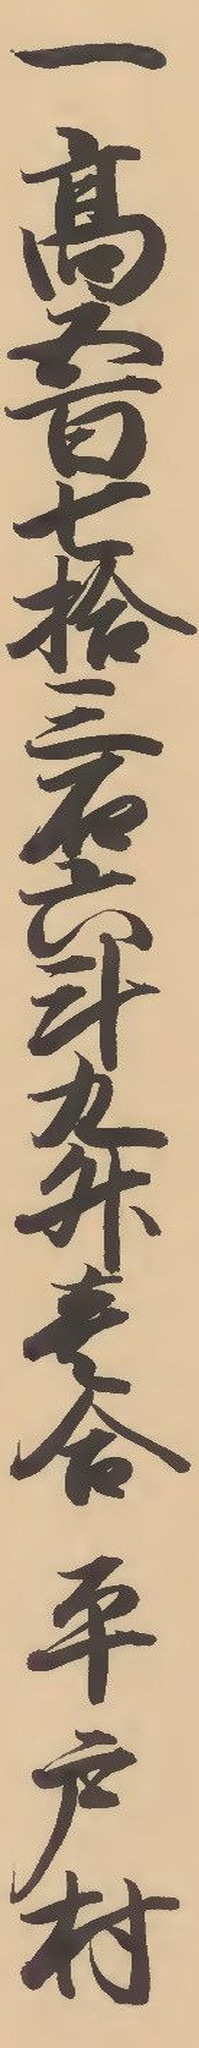一高五百七拾三石六斗九升壱合平戸村
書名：常陸国郷帳
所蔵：国立公文書館 National Archives of Japan
